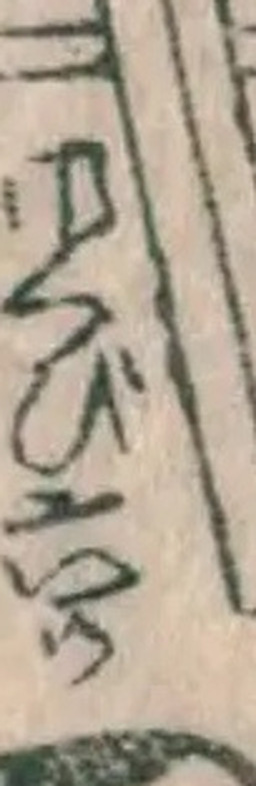御くび六つ
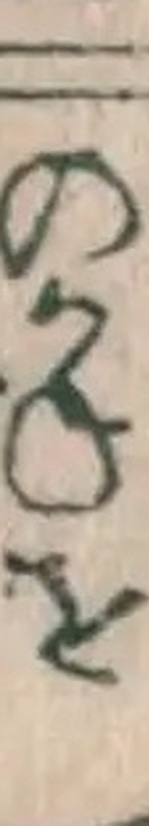のかねを
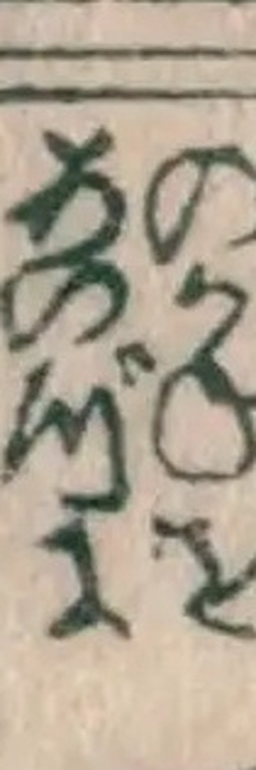あいづに
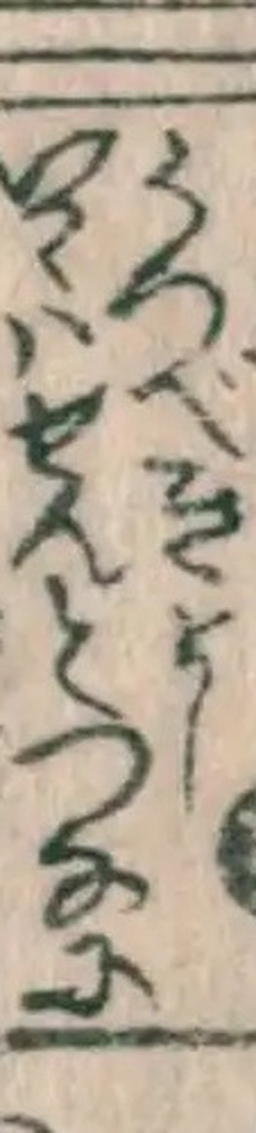いかゝはせんとつなに
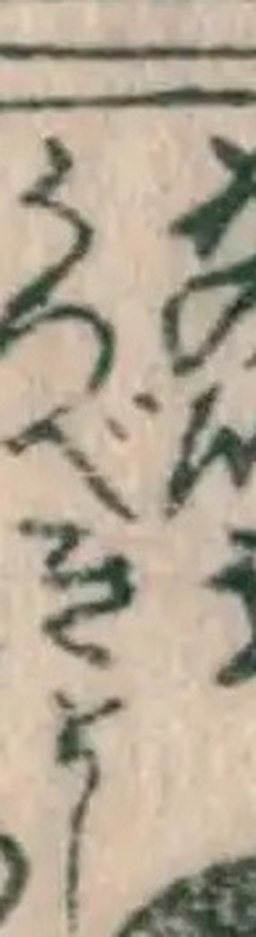うつべきよし
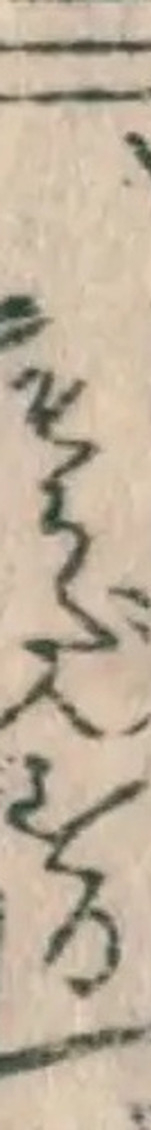そうだんする
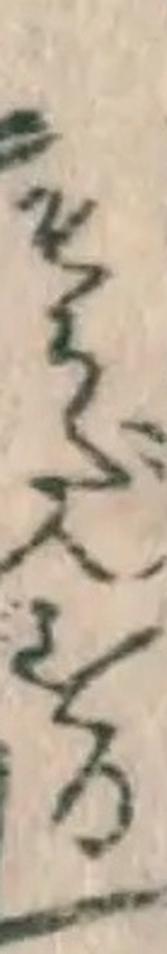そうだんする

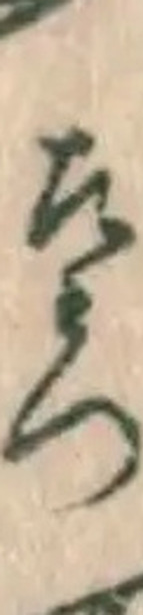左衛門
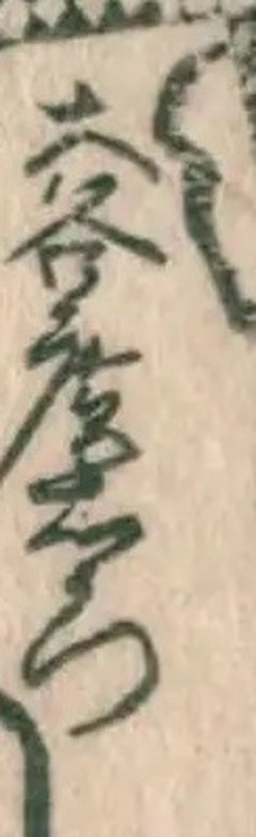大谷広右衛門
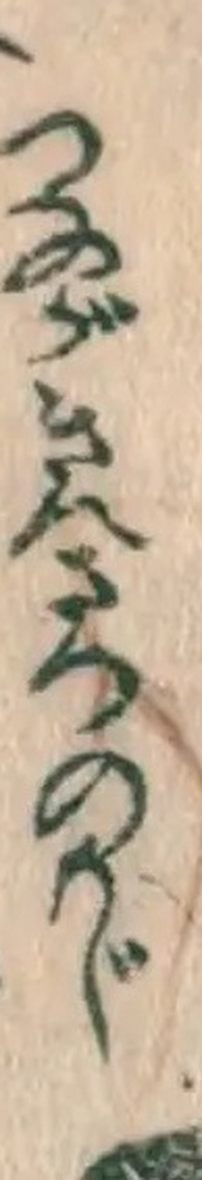つながきんさつのもじ
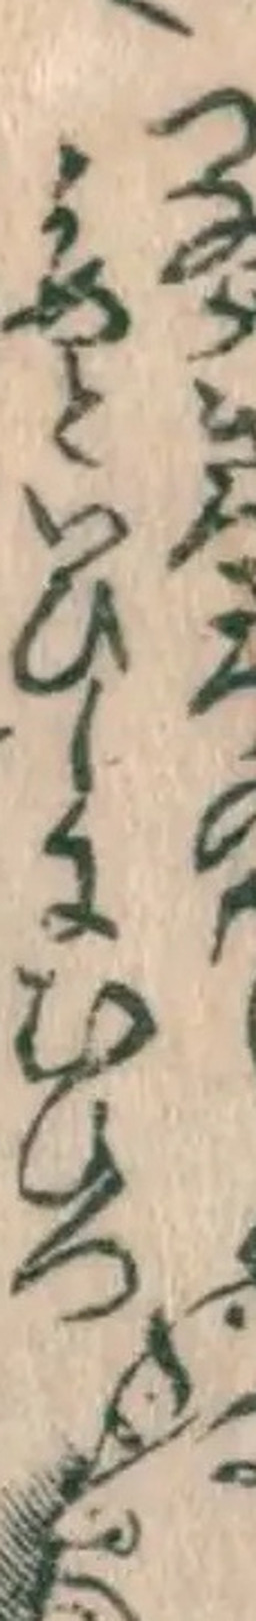よめといひしにむひつ
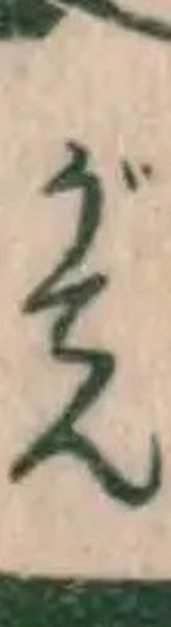がてん
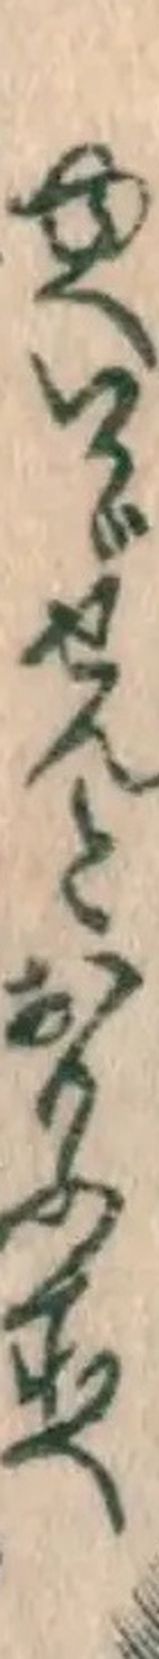ゆへいかゞせんとおもふ所へ
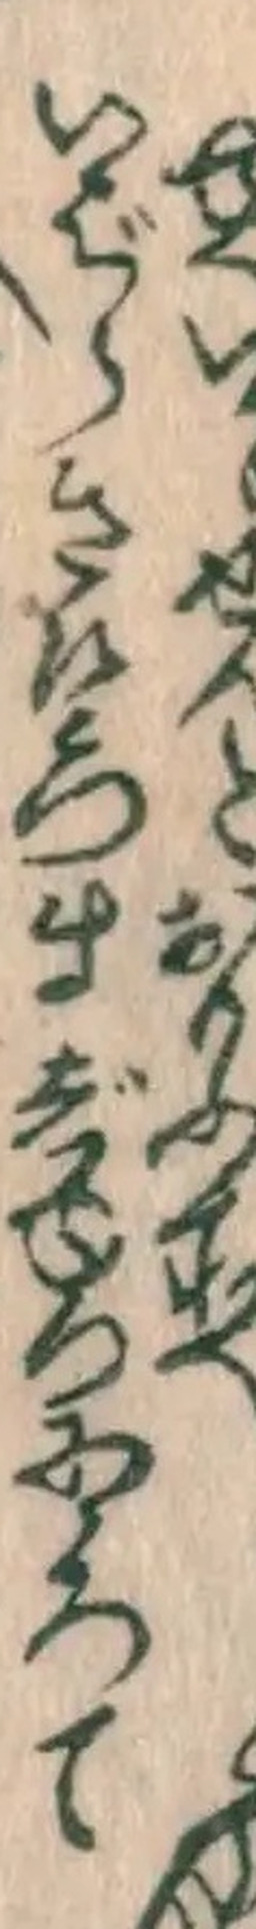いばらき左衛門まじゆつによつて
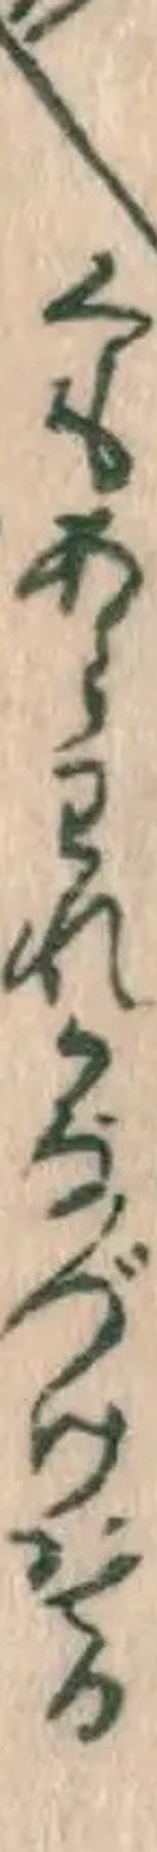くもあらわれかなづけする
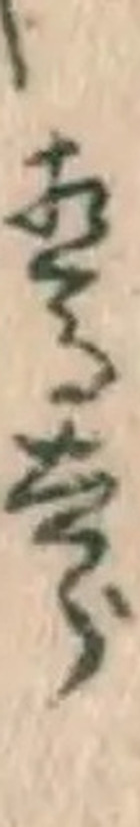相馬太郎
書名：菊慈童酒宴岩窟
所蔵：国立国会図書館 National Diet Library, JAPAN
